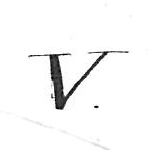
V.
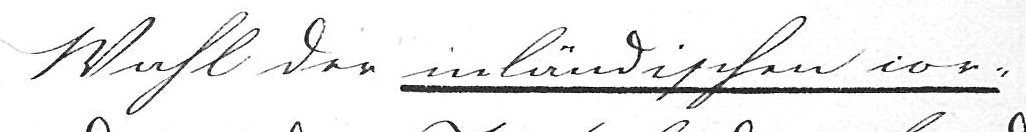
Wahl der inländischen cor-
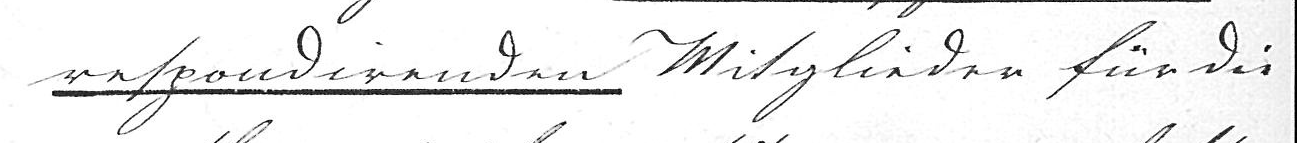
respondirenden Mitglieder für die
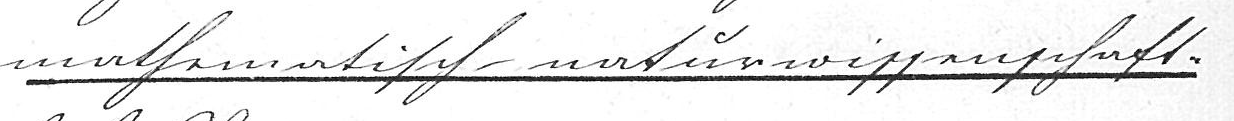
mathematisch-naturwissenschaft--
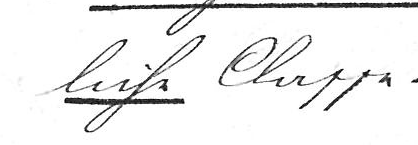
liche Classe.
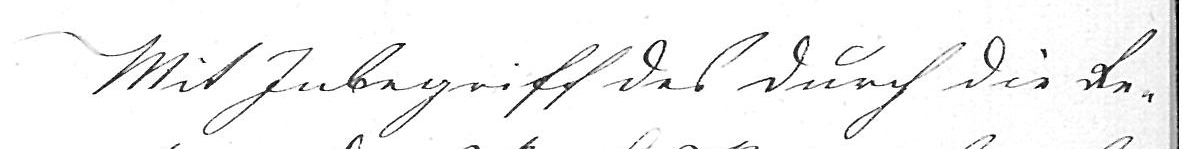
Mit Inbegriff des durch die Re-
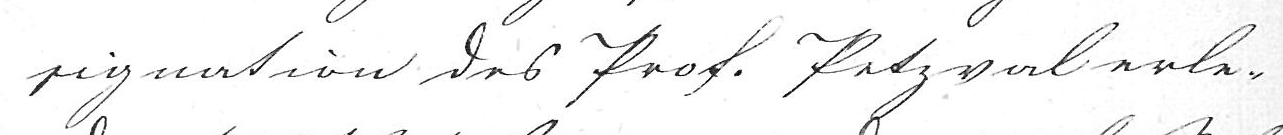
signation des Prof. Petzval erle-
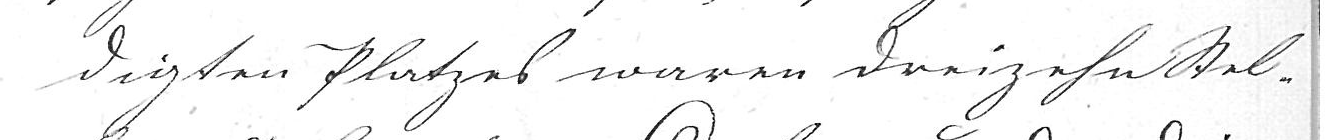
digten Platzes waren dreizehn Stel-
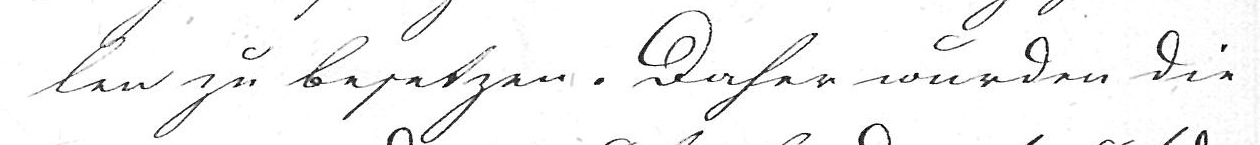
den zu besetzen. Daher wurden die
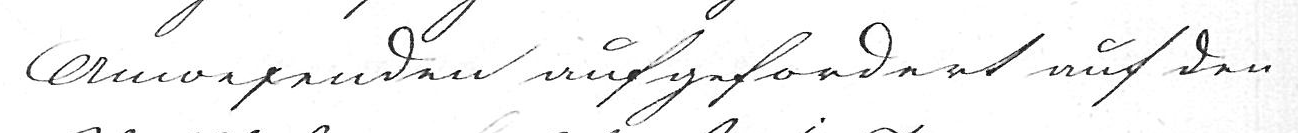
Anwesenden aufgefordert auf den
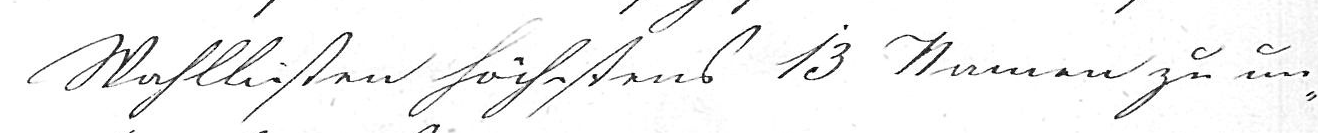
Wahllisten höchstens 13 Namen zu un-
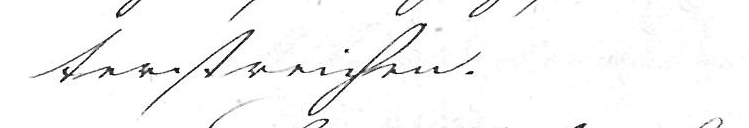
terstreichen.
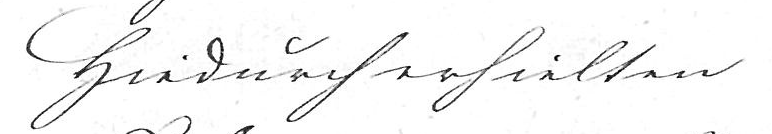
Hiedurch erhielten
